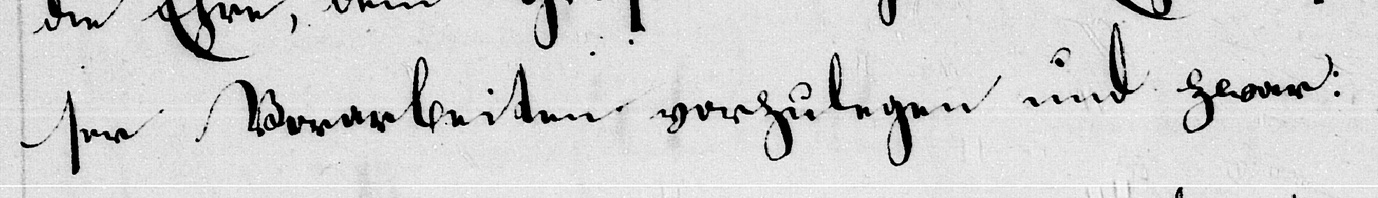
ser Vorarbeiten vorzulegen und zwar:
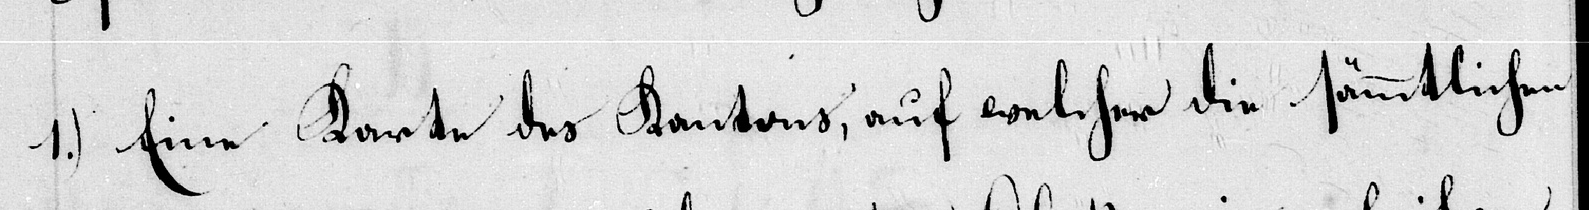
1.) Eine Karte des Kantons, auf welcher die sämmtlichen
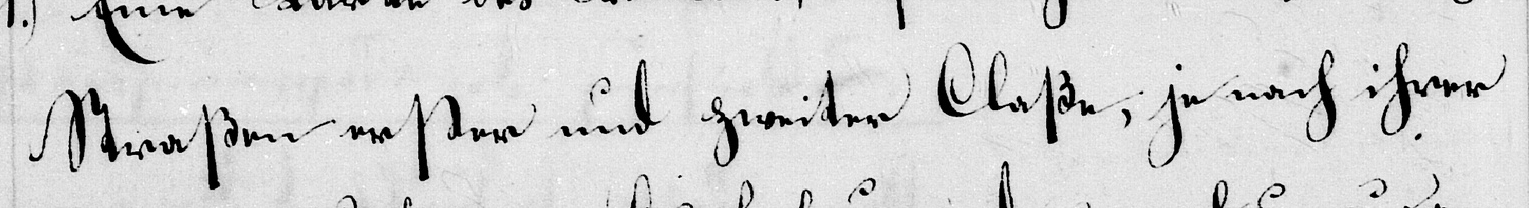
Straßen erster und zweiter Claße, je nach ihrer
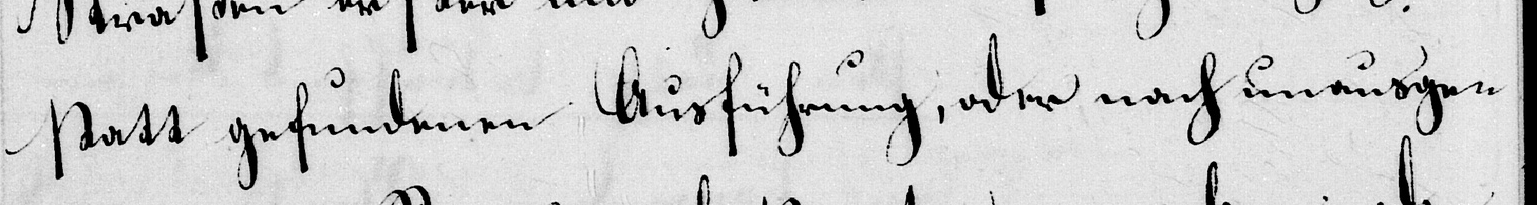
statt gefundenen Ausführung, oder nach unausge¬
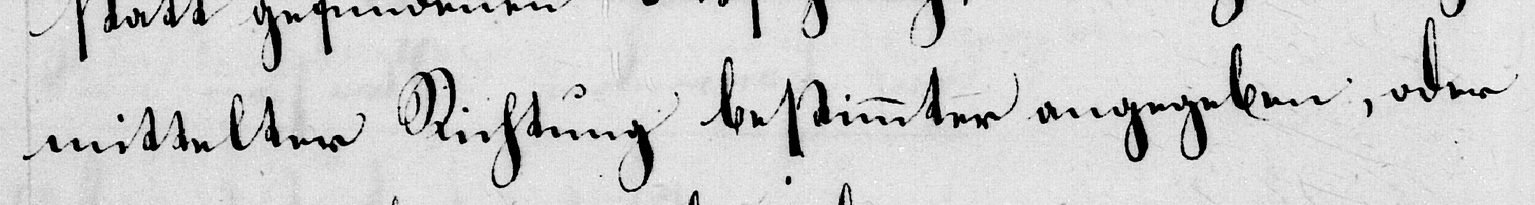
mittelter Richtung bestimmter angegeben, oder
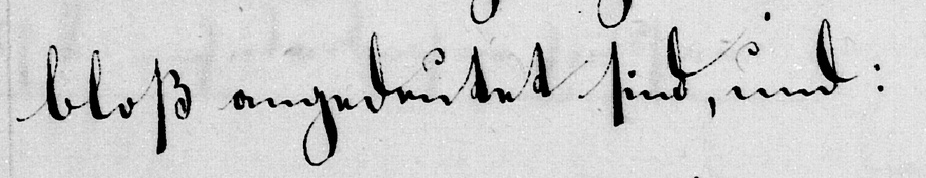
bloß angedeutet sind, und:
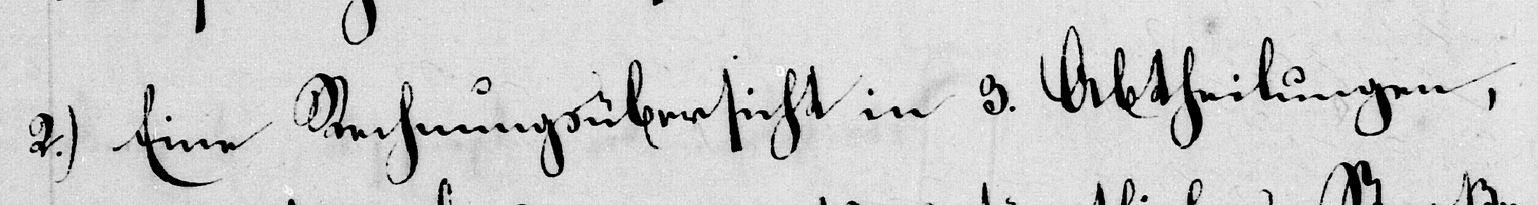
2.) Eine Rechnungsübersicht in 3. Abtheilungen,
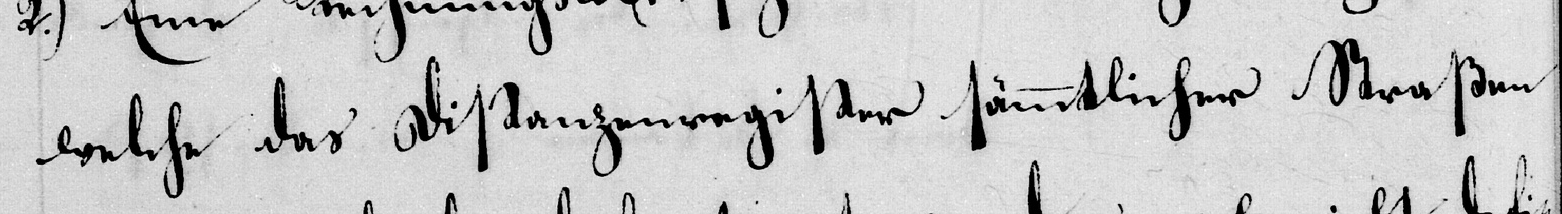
welche das Distanzenregister sämmtlicher Straßen
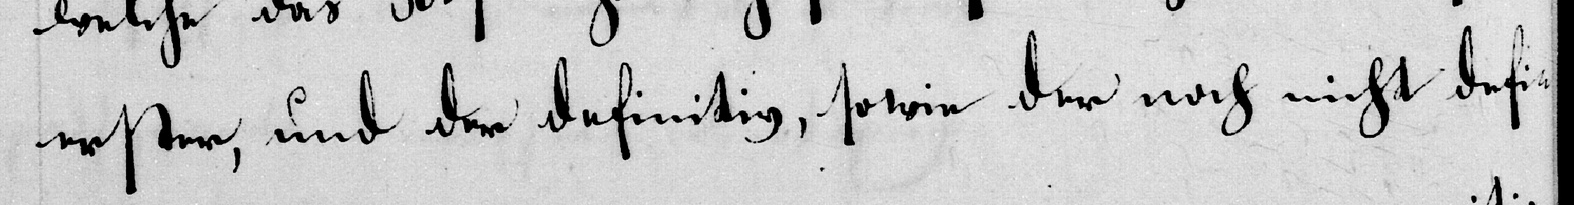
erster, und der definitiv, sowie der noch nicht defi-
